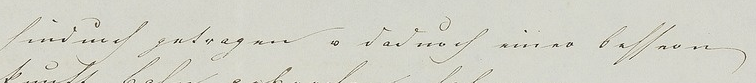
hindurch getragen & dadurch einer bessern
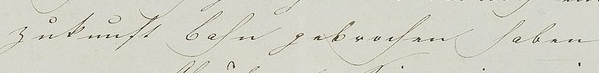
Zukunft Bahn gebrochen haben.
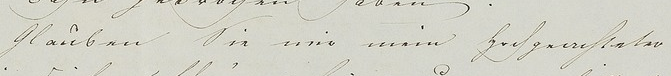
Glauben Sie mir mein hochgeachteter
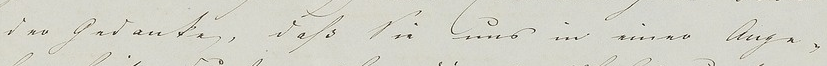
der Gedanke, daß Sie uns in einer Ange-
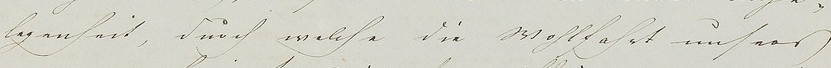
legenheit, durch welche die Wohlfahrt unsers
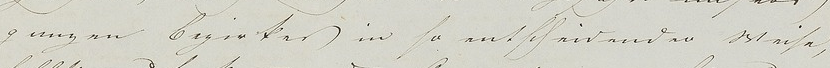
ganzen Bezirkes in so entscheidender Weise,
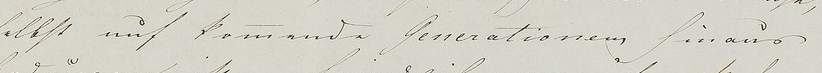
selbst auf kommende Generationen hinaus
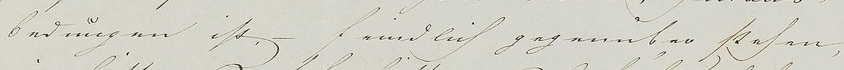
bedungen ist. – feindlich gegenüber stehen,
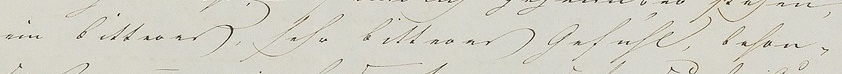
ein bitteres, sehr bitteres Gefühl, beson-
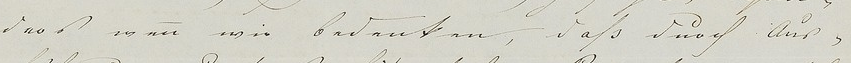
ders wenn wir bedenken, daß durch Aus-
